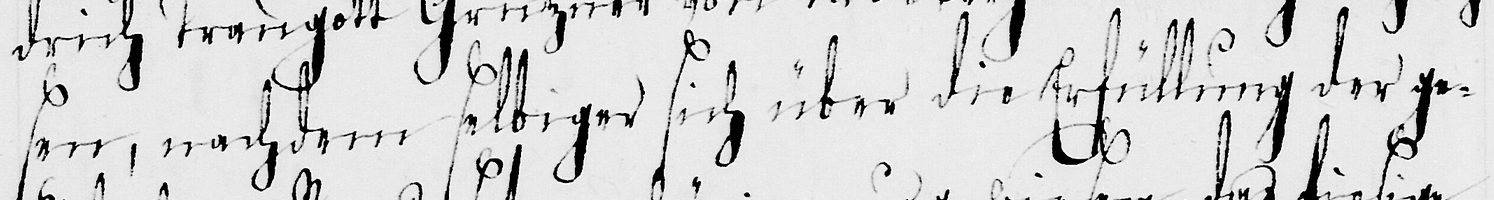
sen, nachdem selbiger sich über die Erfüllung der ge¬
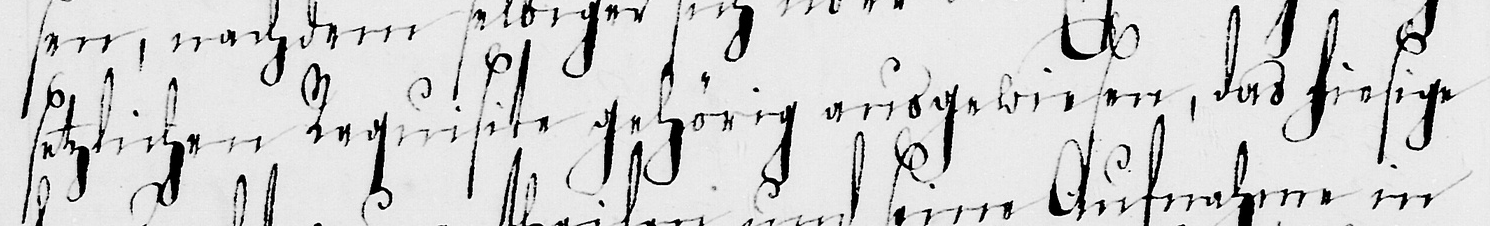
setzlichen Requisite gehörig ausgewiesen, das hiesige
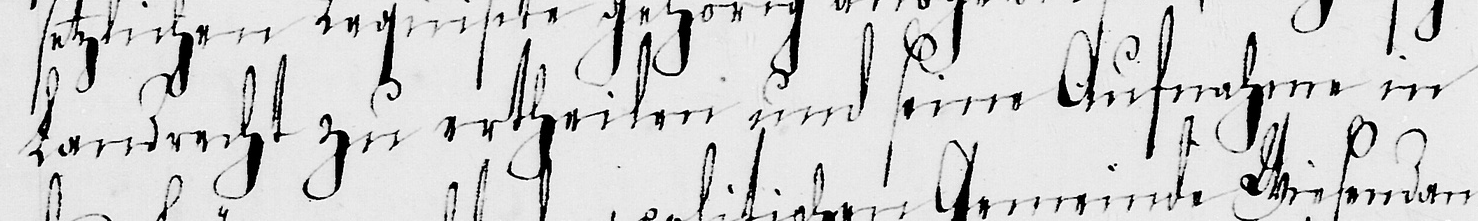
Landrecht zu ertheilen und seine Aufnahme in
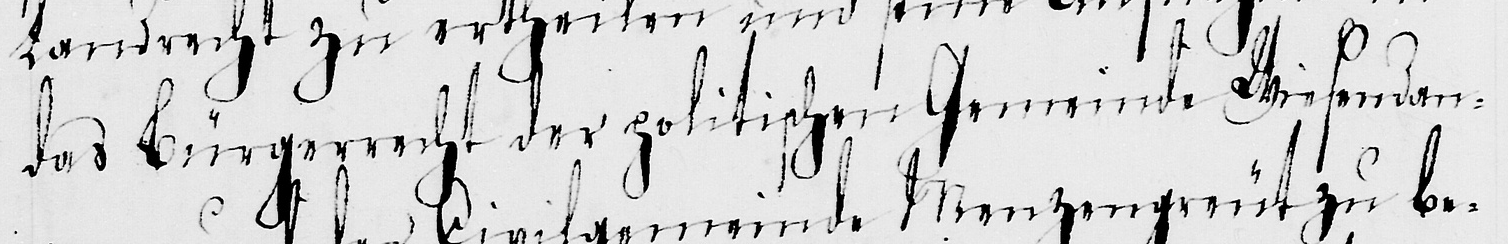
das Bürgerrecht der politischen Gemeinde Wiesendan¬
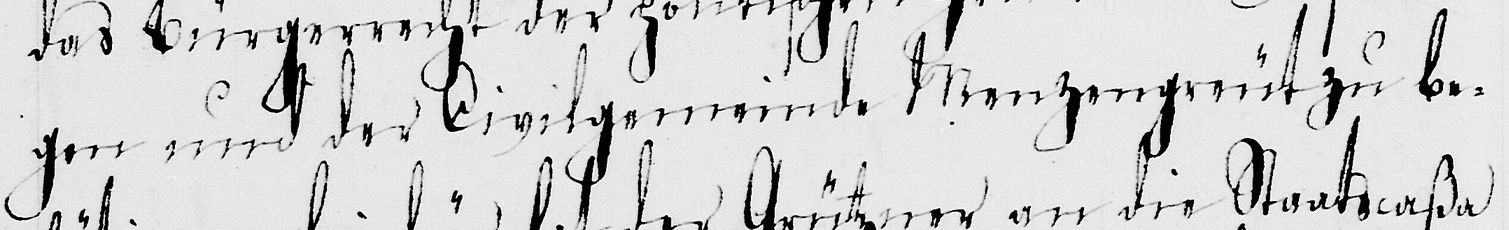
gen und der Civilgemeinde Manzengreut zu be¬
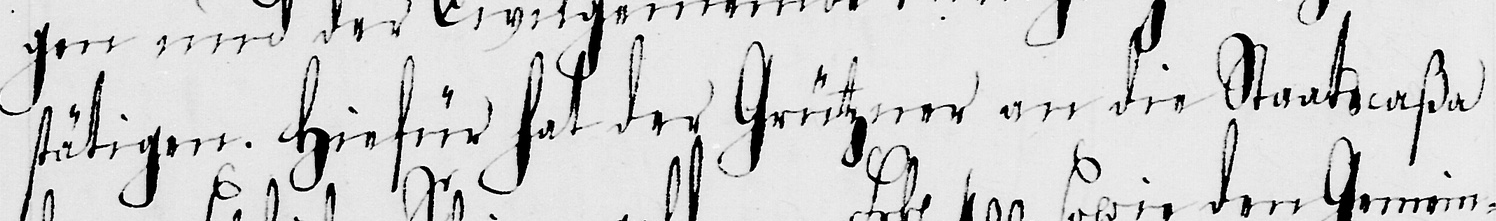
stätigen. Hiefür hat der Grützner an die Staatscaßa
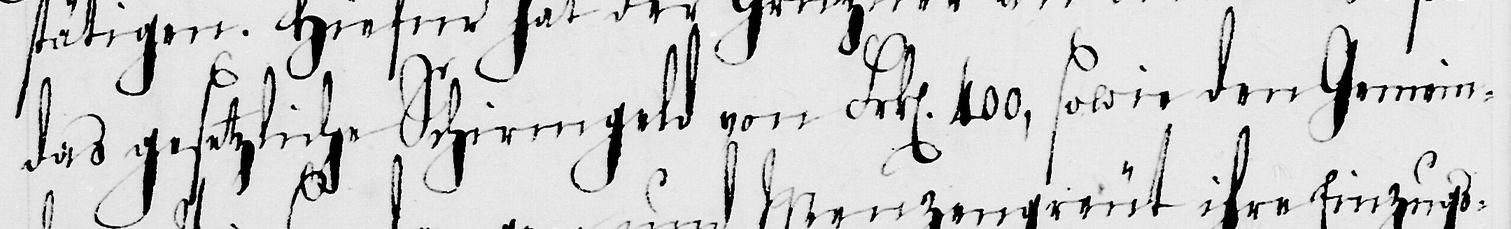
das gesetzliche Schirmgeld von Frk[en]. 400, sowie den Gemein¬
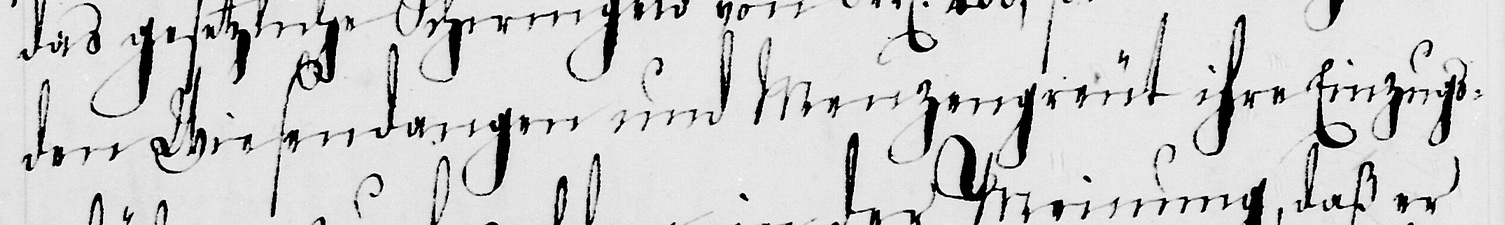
den Wiesendangen und Manzengreut ihre Einzugs¬
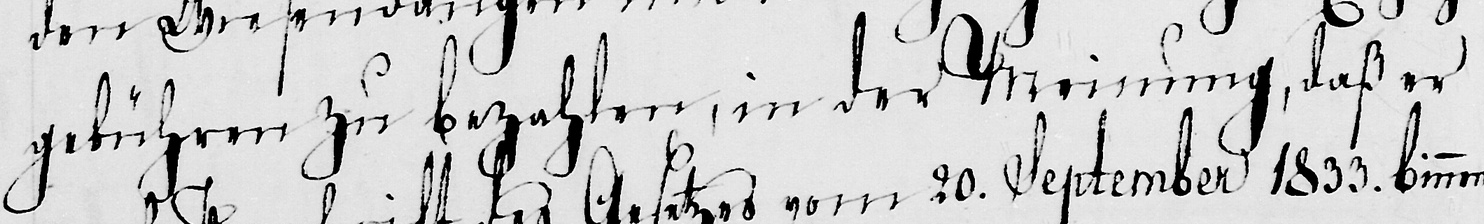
gebühren zu bezahlen, in der Meinung, daß er
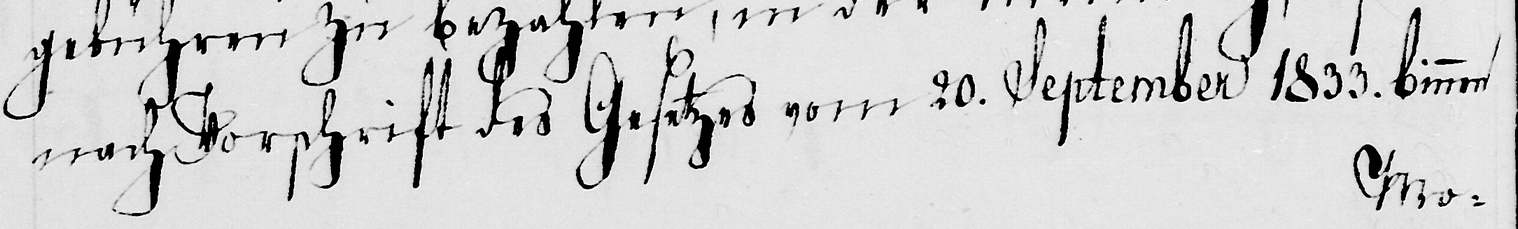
nach Vorschrift des Gesetzes vom 20. September 1833. binnen
